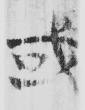或
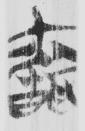䎽
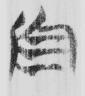於
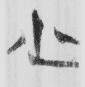少
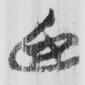臣
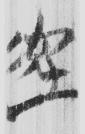𫊟
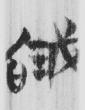{戈今}
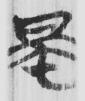{日虫}
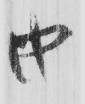女
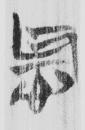怠
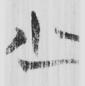少
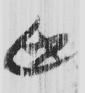臣
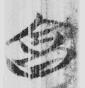合
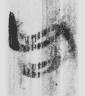句
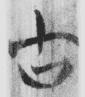古
